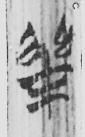𪪋（哉）
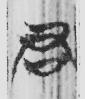君
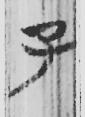子
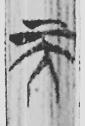天
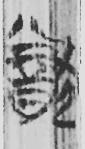猶
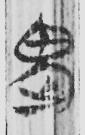畏
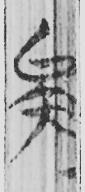矣
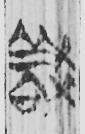敬
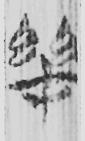𪪋（哉）
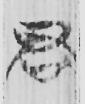君
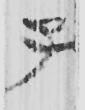子
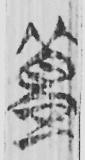{𦭝五}
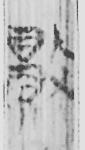{貝貝攴}
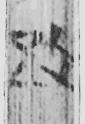改
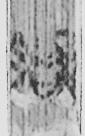䌛
